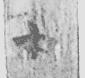七十
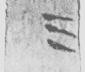三
